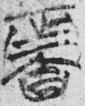啻（惕）
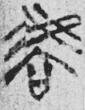○（號）
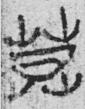莫（暮）
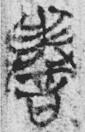譽（夜）
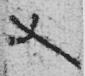又（有）
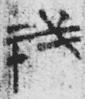戎
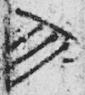勿
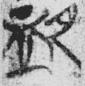卹（恤）
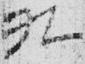九
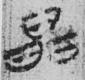晶
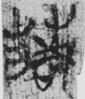○（藏）
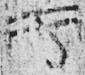于
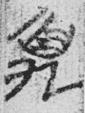○（頄）
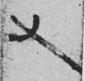又
